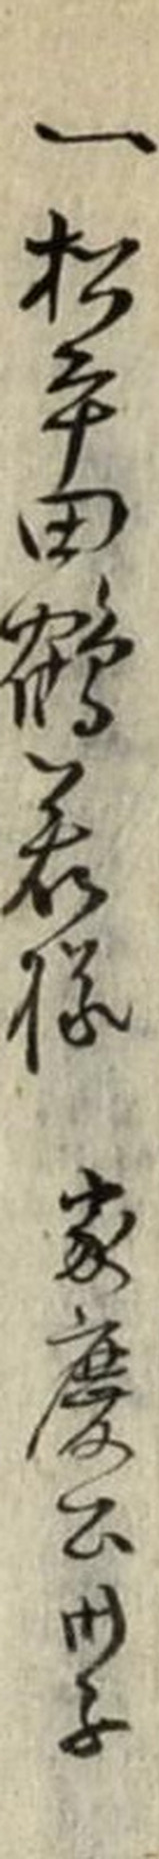一松平田鶴若様家慶公御子
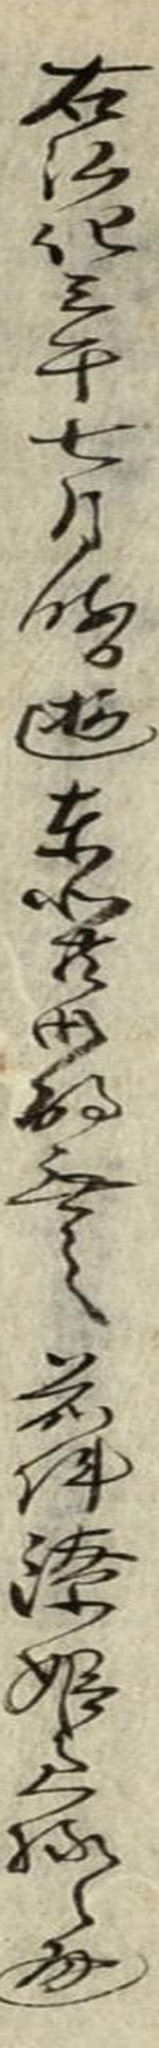右弘化三午七月晦日逝東北共御触無之前件鐐姫君様之通
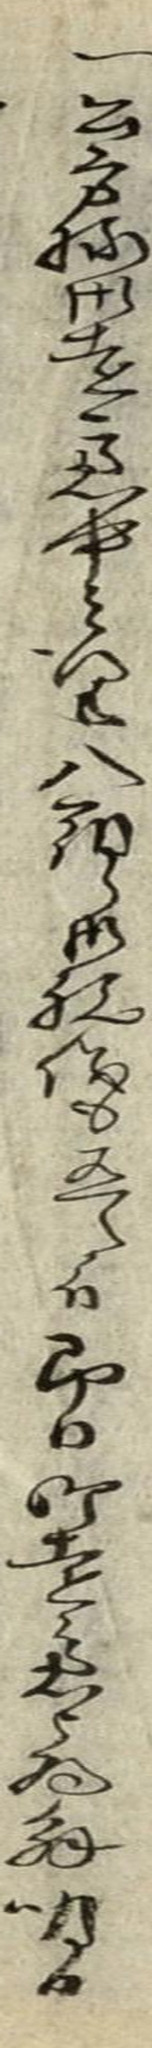一公方様御遠慮中に候得共八朔之御祝儀も有之に付即日御遠慮被為解明日
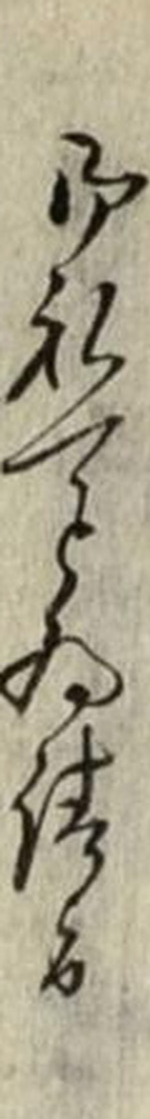御礼可被為請旨
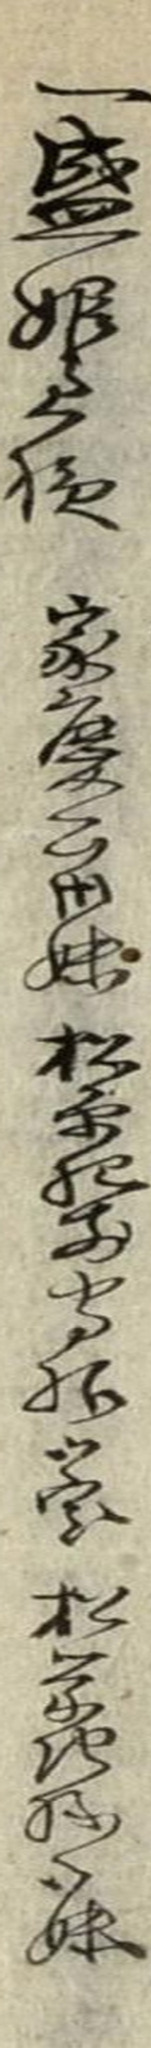一盛姫君様家慶公御妹松平肥前守様御室松栄院様御妹
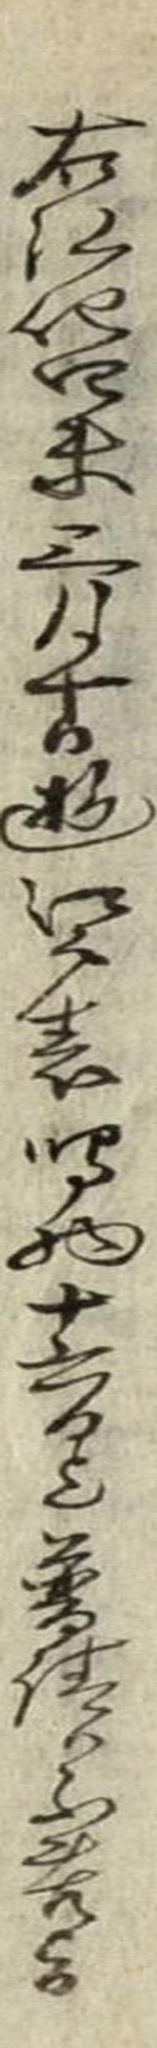右弘化四未三月十日逝江戸表鳴物十六日迄普請は不苦旨
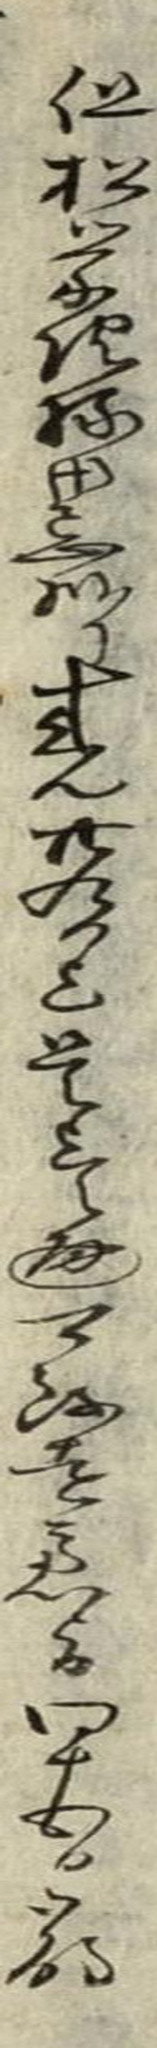但松栄院様御忌掛り来ル廿九日迄是迄之通可致遠慮旨同十五日御触
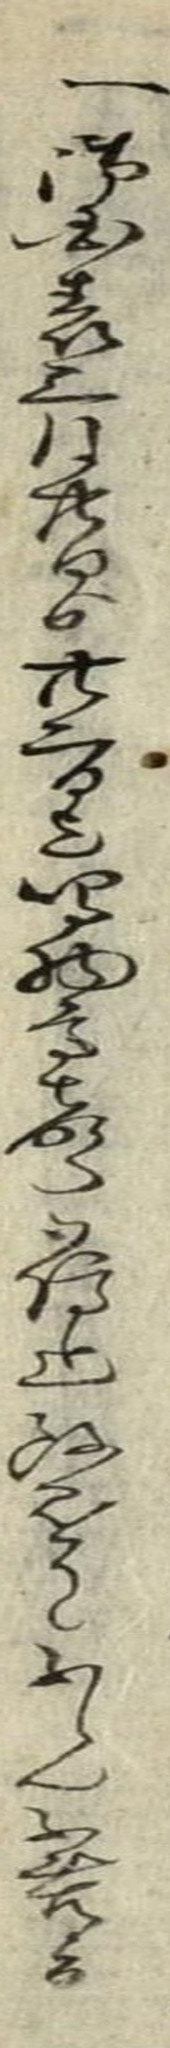一御国表三月廿日ゟ廿二日迄鳴物高声御停止致懸り候ふしん不苦旨
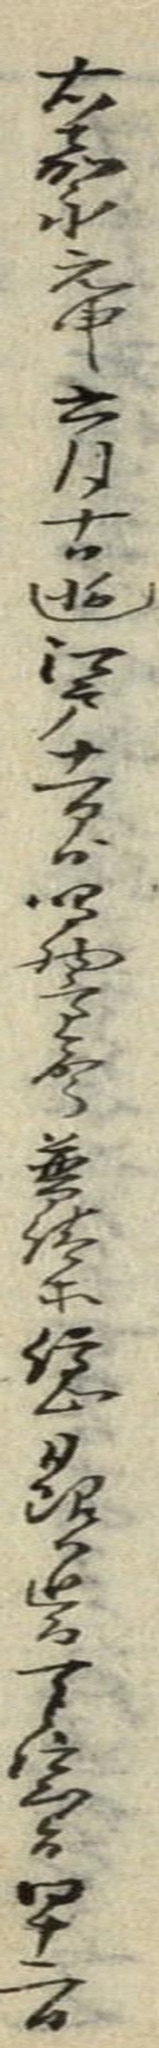右嘉永元申六月十日逝江戸十一日ゟ鳴物高声普請等停止日限は追て可被仰出旨同十二日
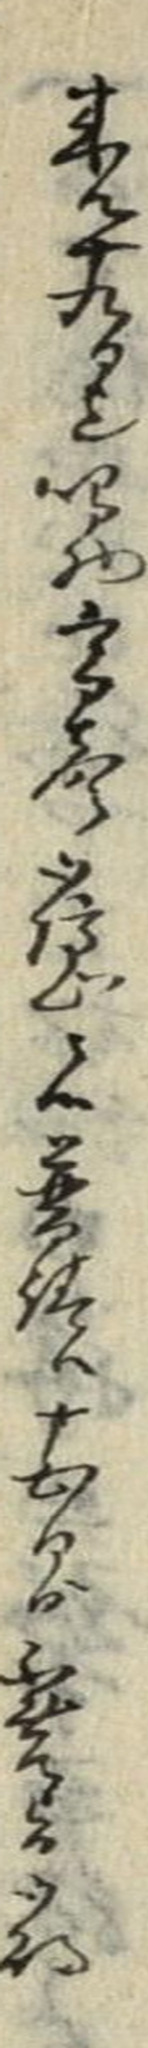来ル十九日迄鳴物高声御停止に候普請は十五日ゟ不苦旨御触
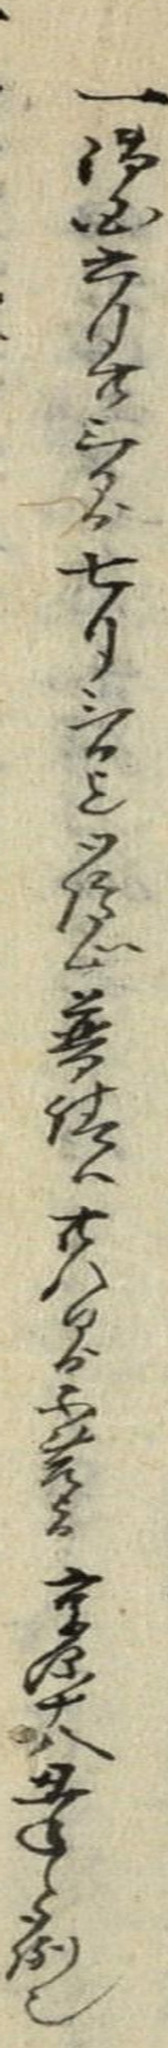一御国六月廿三日ゟ七月三日迄御停止普請は廿八日ゟ不苦旨享保十八丑年之御例也
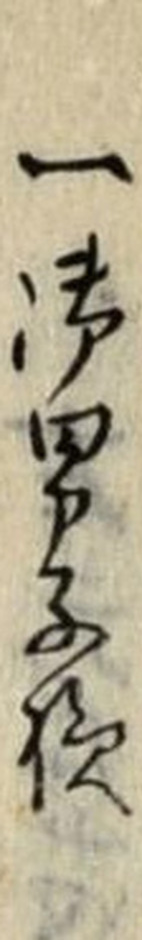一御男子様
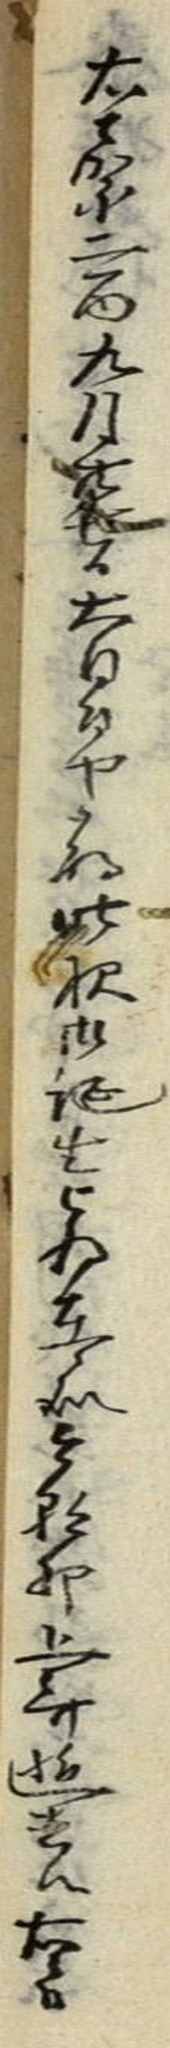右嘉永二酉九月廿七日大目付中御触此夜御誕生被為在候処今朝卯上刻逝去候右に付
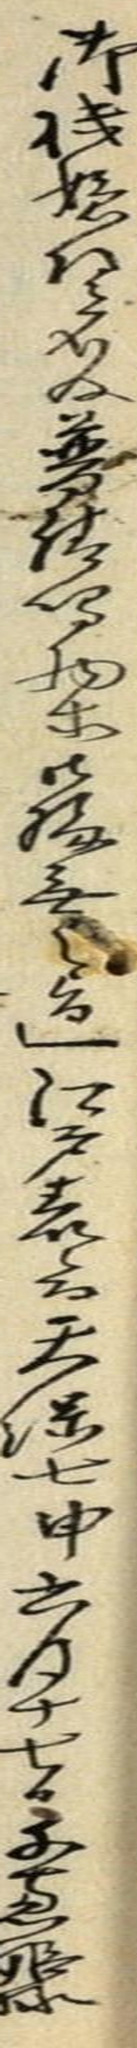御機嫌伺に不及普請鳴物等御構無之旨」江戸表にて天保七申六月十七日千恵姫様
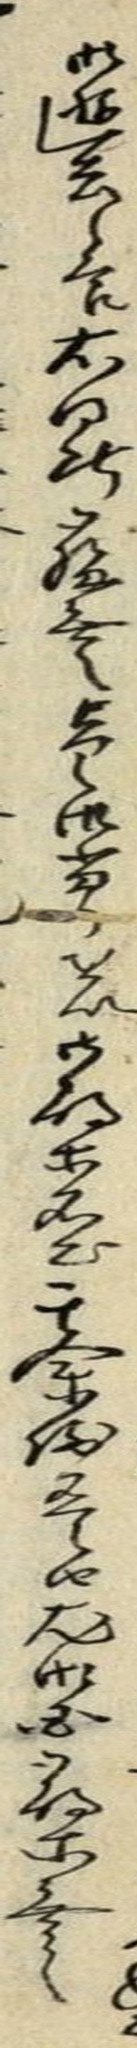御逝去之節右同断御構無之旨之御当りを以御触等不出其余例有之由尤御国御触等無之
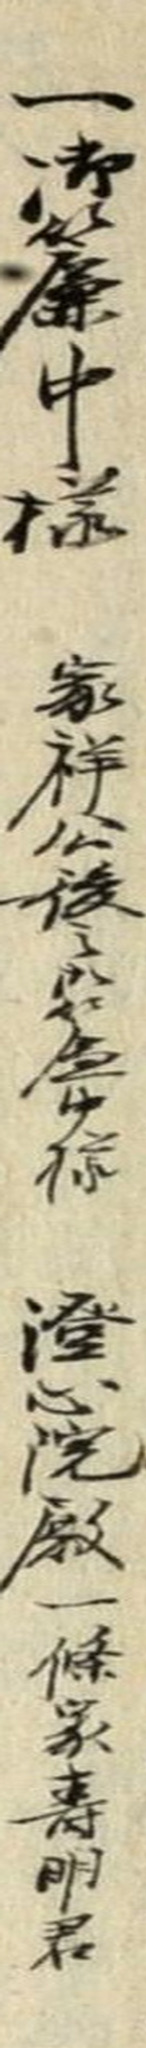一御簾中様家祥公後之御簾中様澄心院殿一条家寿明君
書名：御停止異変死失
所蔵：福井県文書館 Fukui Prefectural Archives
